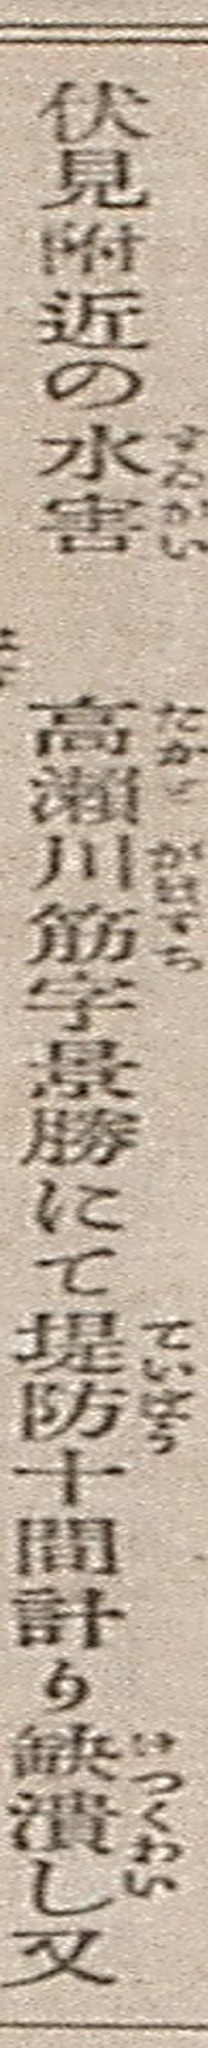伏見附近の水害高瀬川筋字景勝にて堤防十間計り缺潰し又
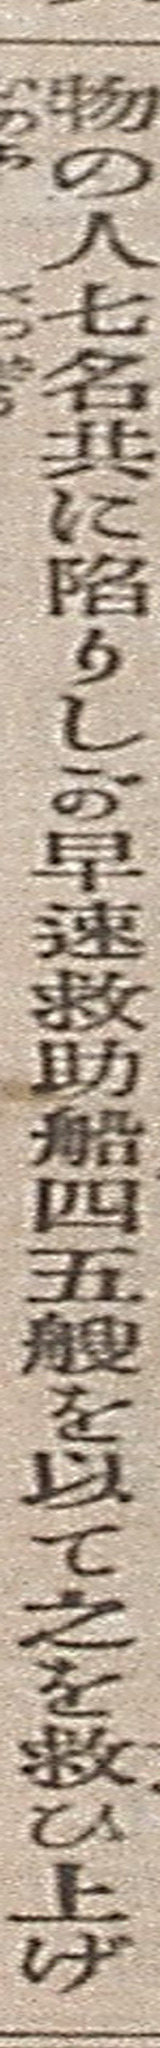物の人七名共に陥りしが早速救助船四五艘を以て之を救ひ上げ
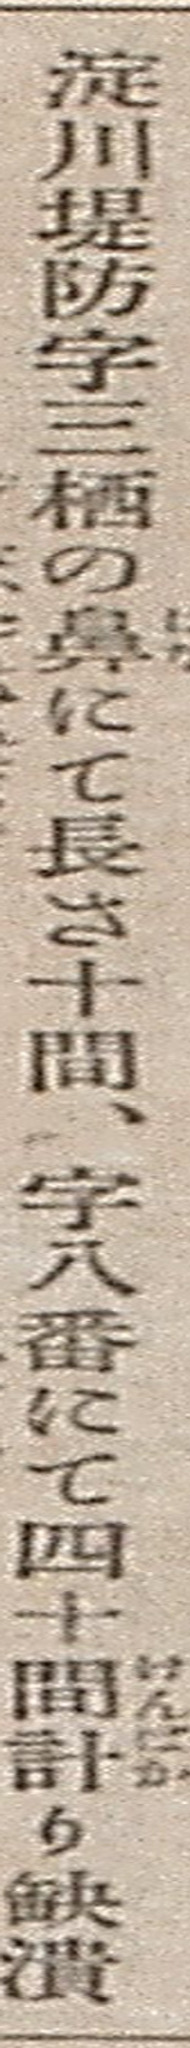淀川堤防字三栖の鼻にて長さ十間、字八番にて四十間計り缺潰
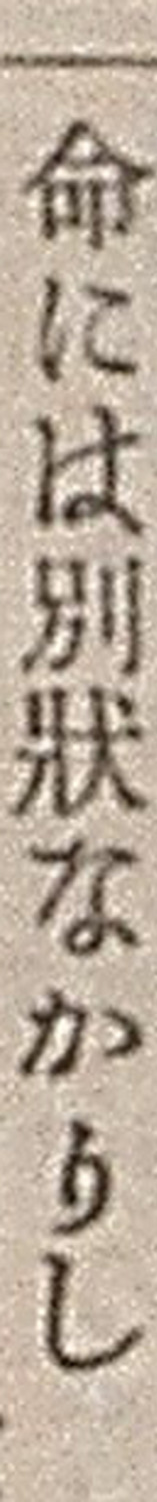命には別状なかりし
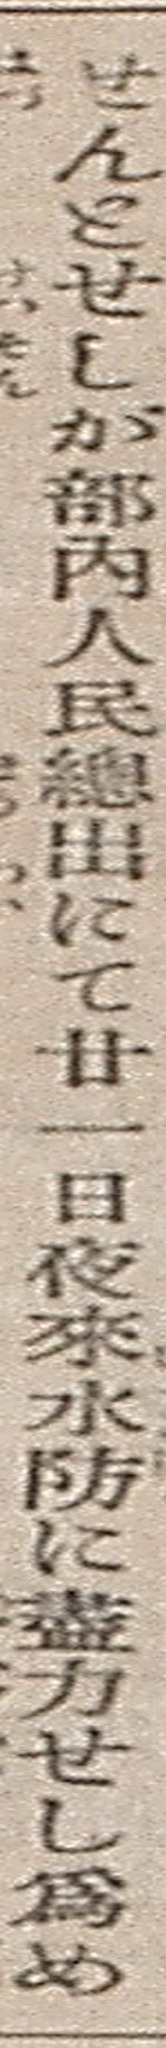せんとせしが部内人民総出にて廿一日夜来水防に尽力せし為め
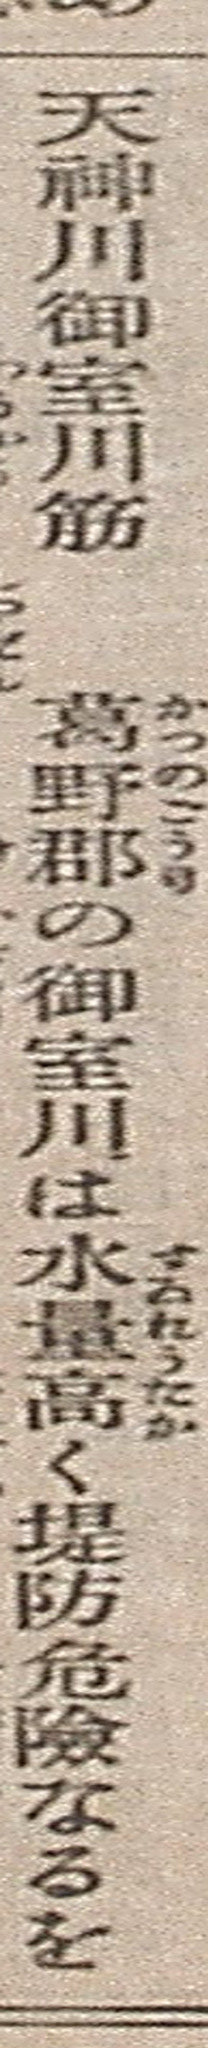天神川御室川筋葛野郡の御室側は水量高く堤防危険なるを
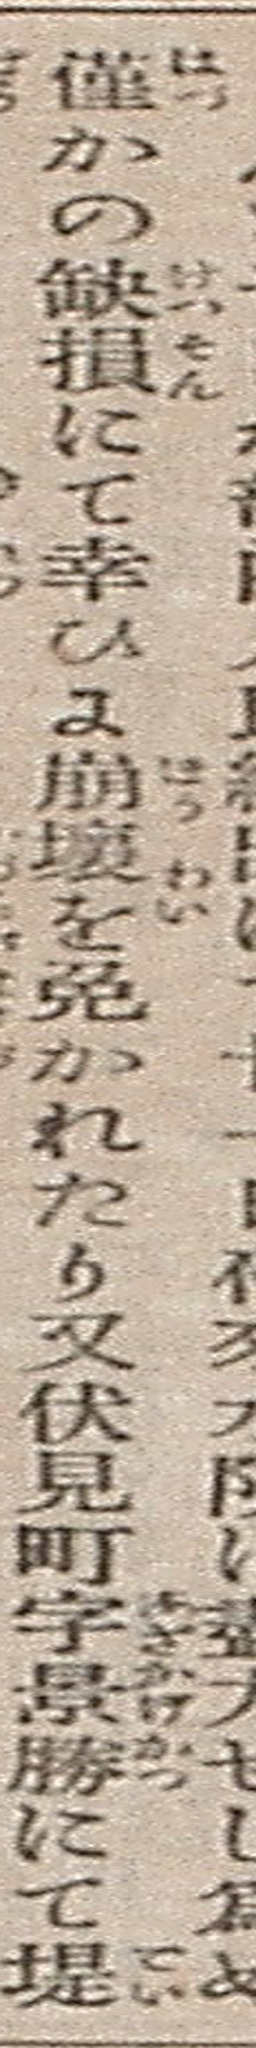僅かの缺損にて幸ひに崩壊を免かれたり又伏見町字景勝にて堤
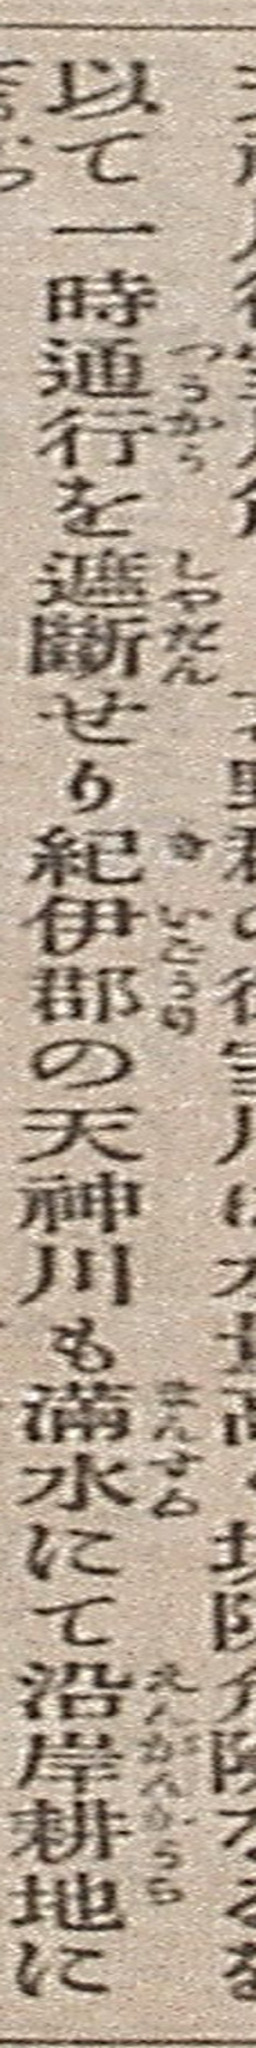以て一時通行を遮断せり紀伊郡の天神川も満水にて沿岸耕地に
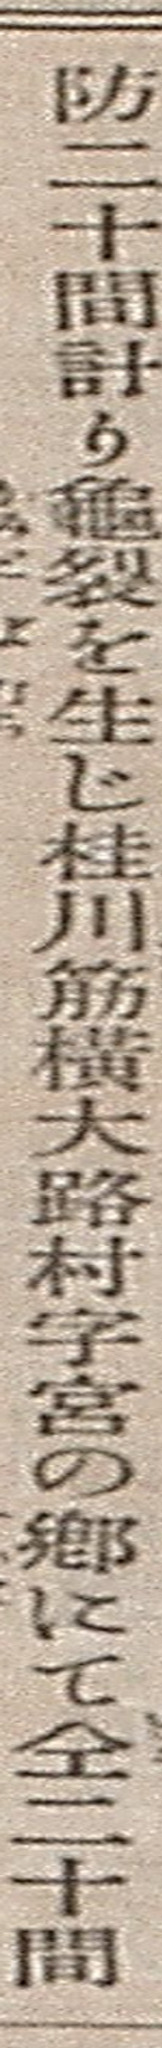防二十間計り亀裂を生じ桂川筋横大路村字宮の郷にて同二十間
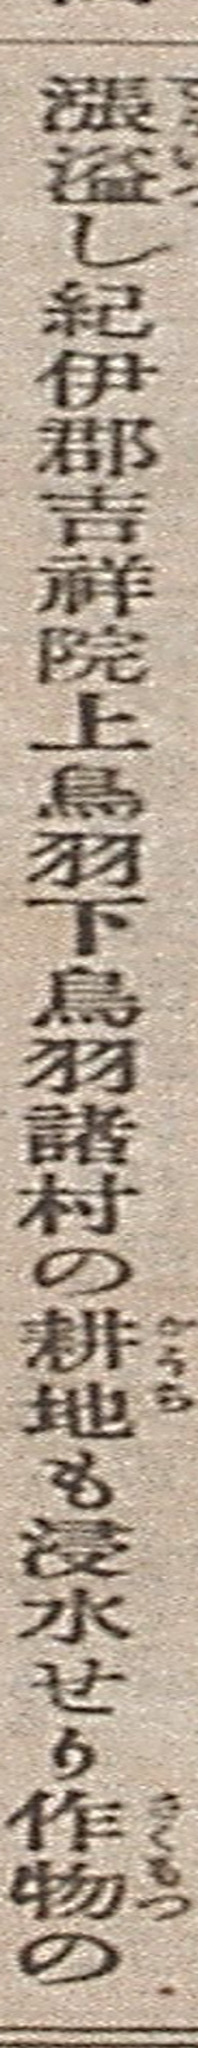漲溢し紀伊郡吉祥院上鳥羽下鳥羽諸村の耕地も浸水せり作物の
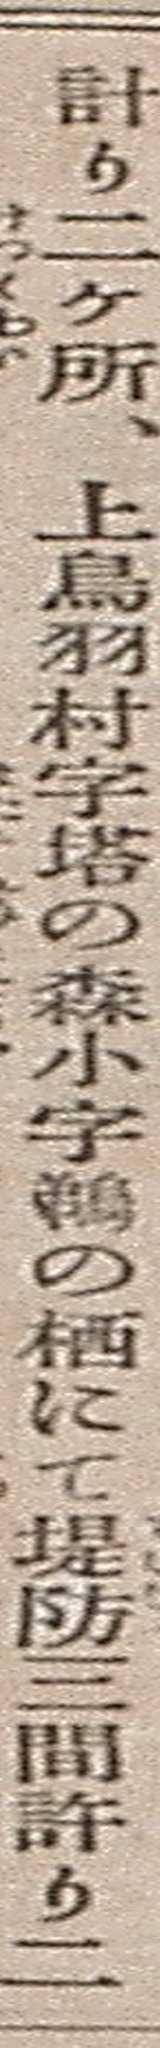けいり二ヶ所、上鳥羽村字塔の森小字鵜の栖にて堤防三間許り二
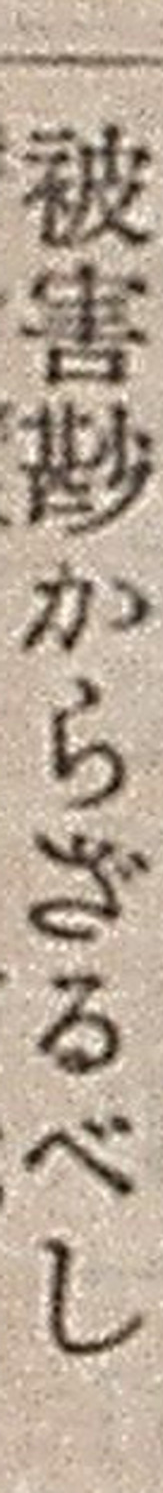火害抄からざるべし
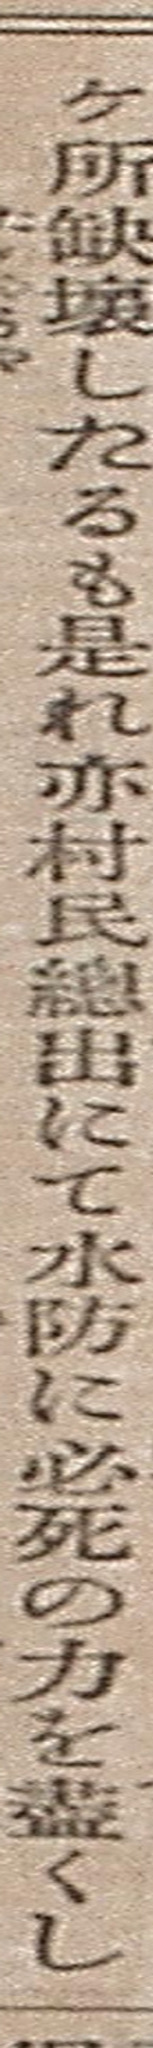ヶ所缺壊したるも是れ亦村民総出にて水防に必死の力を盡くし
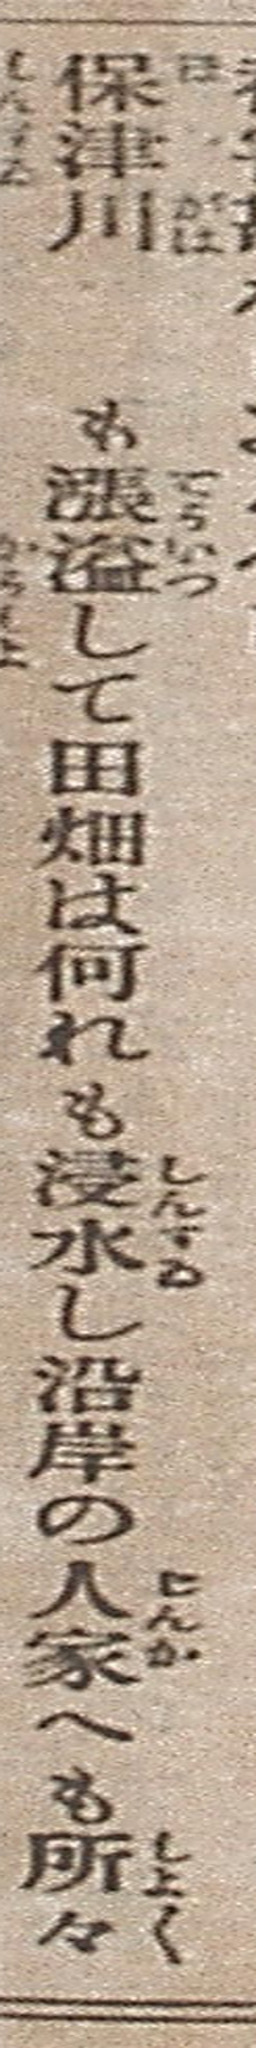保津川も漲溢して田畑は何れも浸水し沿岸の人家へも所々
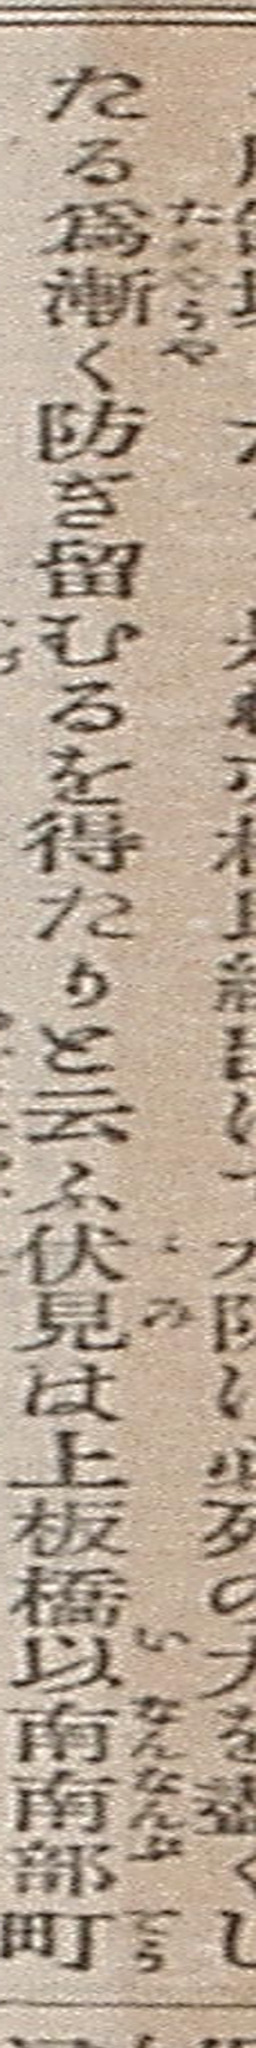たる為漸く防ぎ留むるを得たりと云ふ伏見は上板橋以南南部町
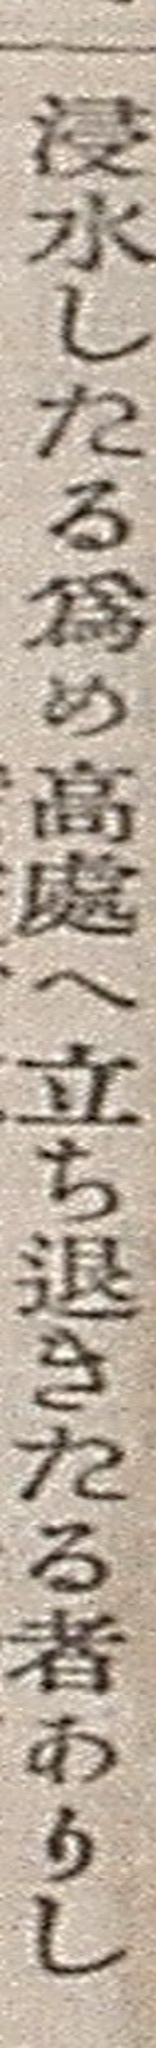浸水したる為め高処へ立ち退きたる者ありし
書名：風俗畫報臨時増刊第百二十八號　洪水被害録（下）
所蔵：東京大学地震研究所図書室 Earthquake Research Institute Library, The University of Tokyo, JAPAN
